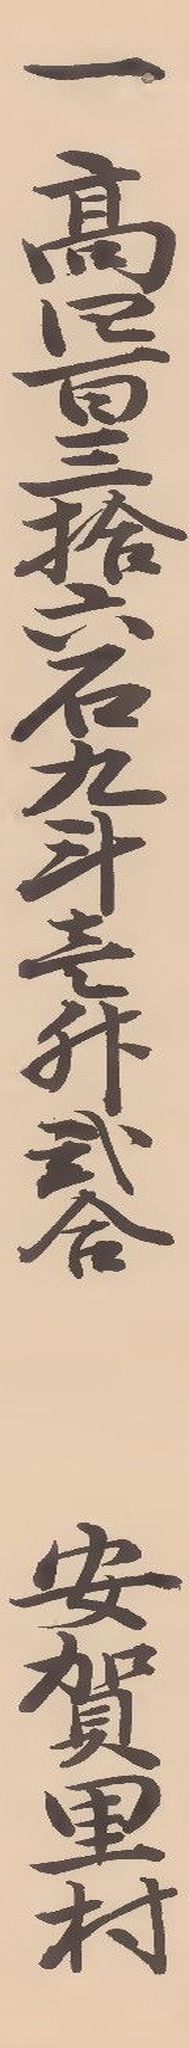一高四百三拾六石九斗壱升弐合安賀里村
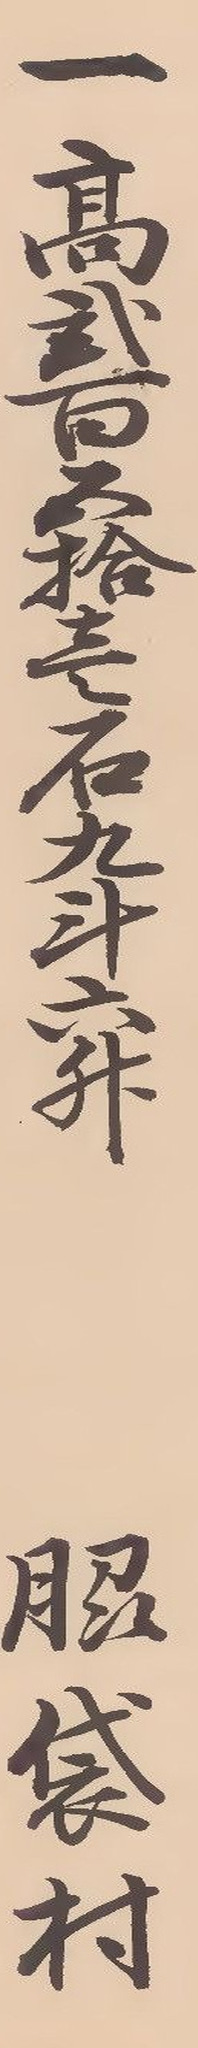一高弐百五拾壱石九斗六升脇袋村
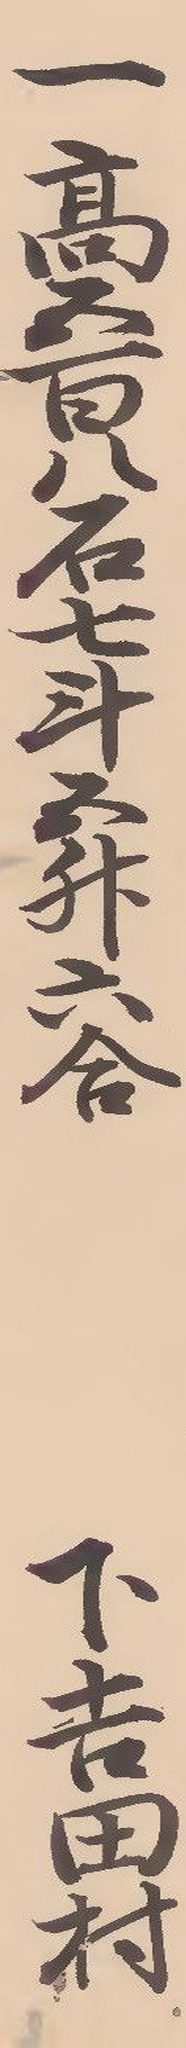一高五百八石七斗五升六合下吉田村

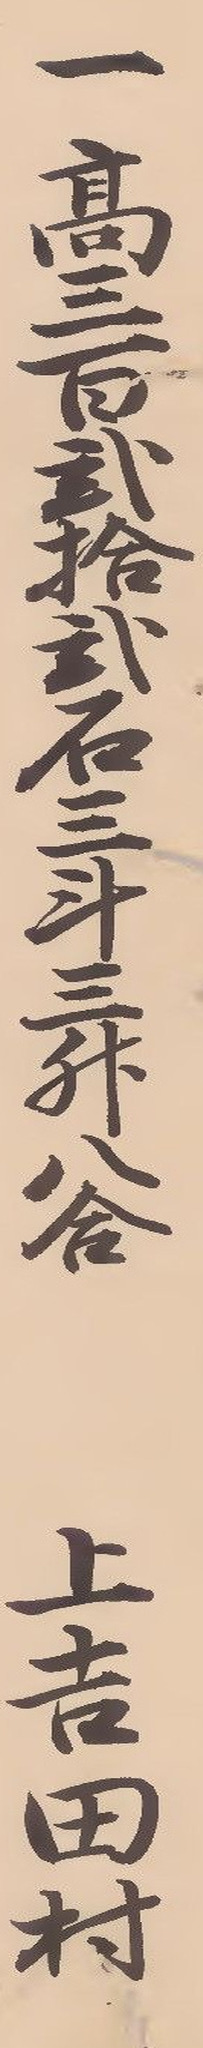一高三百弐拾弐石三斗三升八合上吉田村
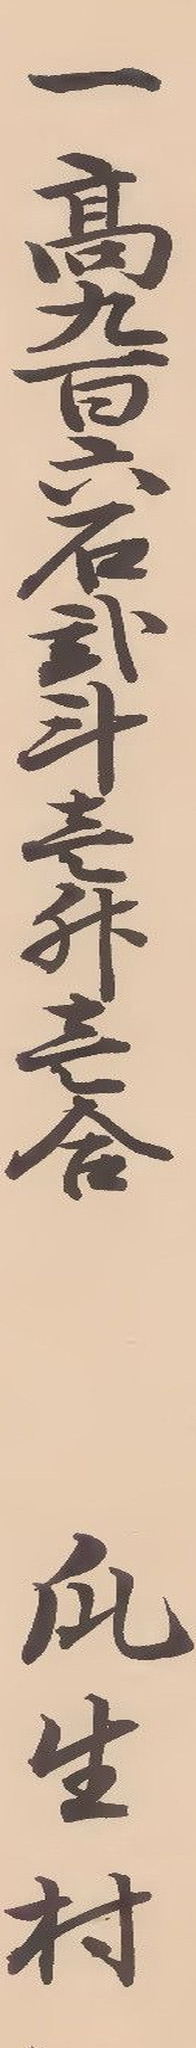一高九百六石弐斗壱升壱合瓜生村
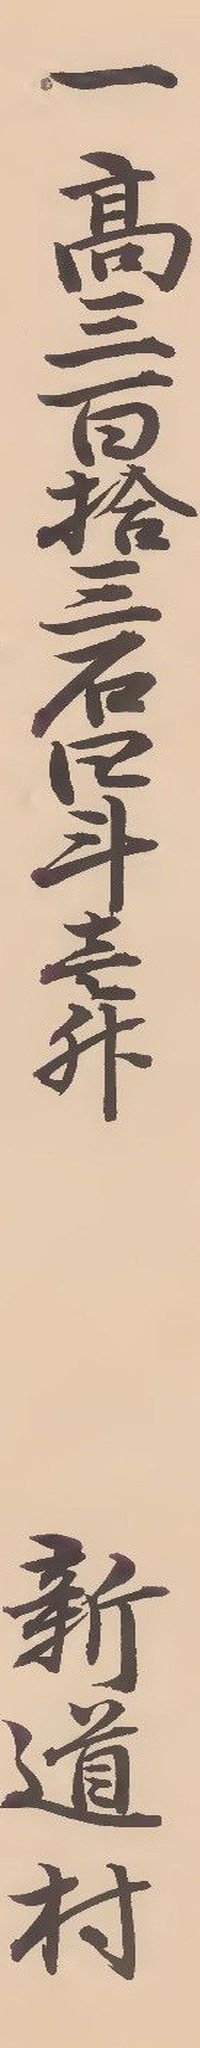一高三百拾三石四斗壱升新道村
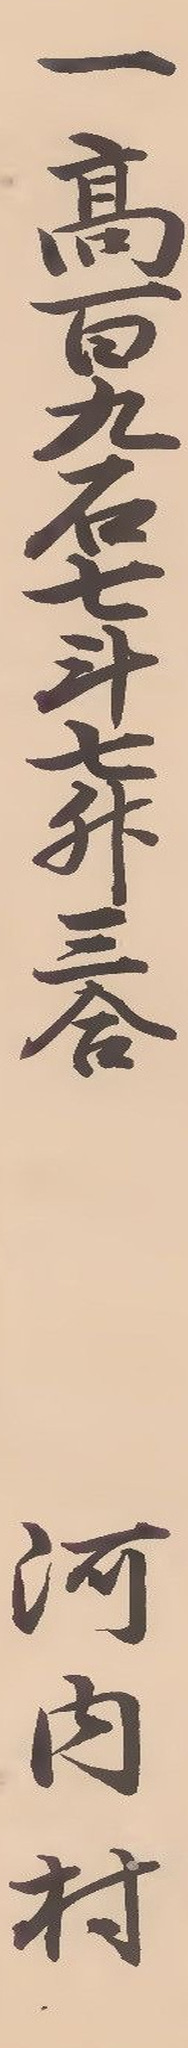一高百九石七斗七升三合河内村
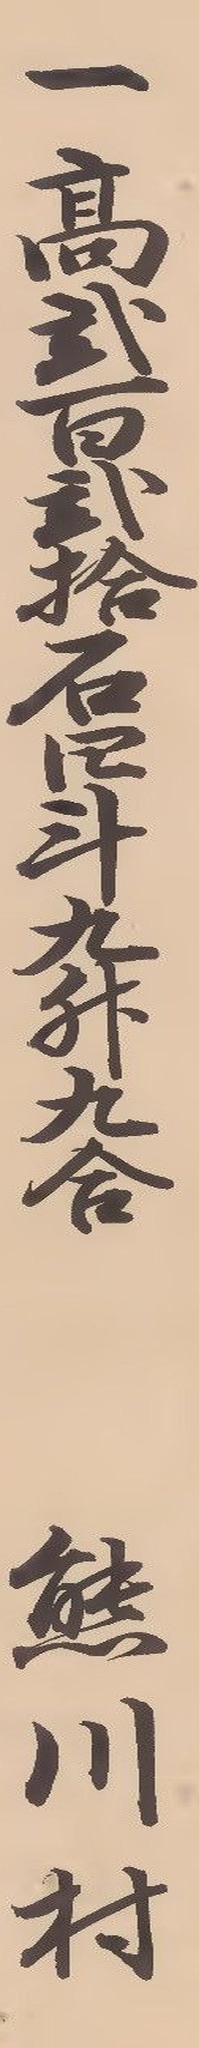一高弐百弐拾石四斗九升九合熊川村
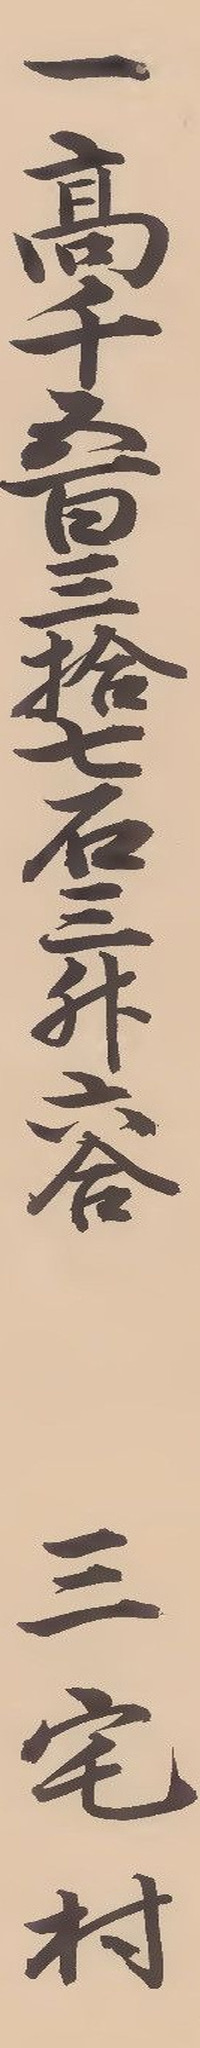一高千五百三拾七石三升六合三宅村
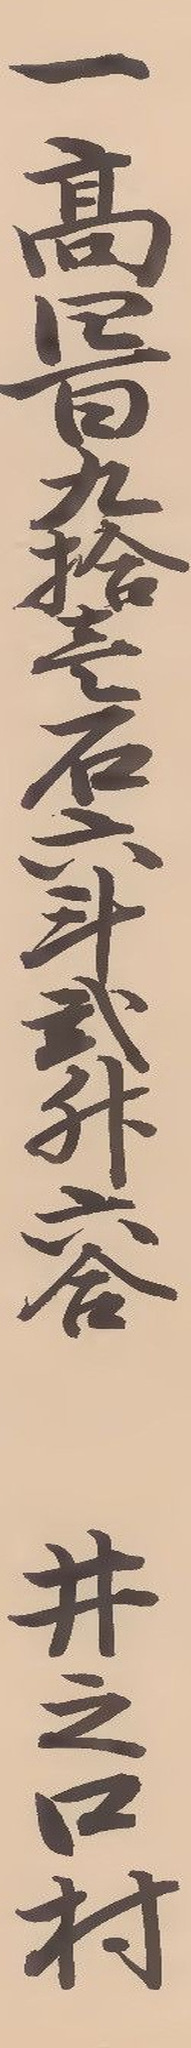一高四百九拾壱石六斗弐升六合井之口村
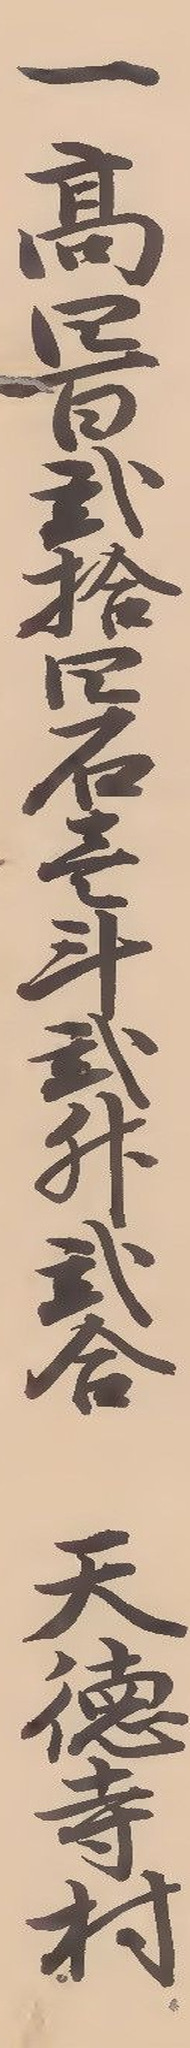一高四百弐拾四石壱斗弐升弐合天徳寺村

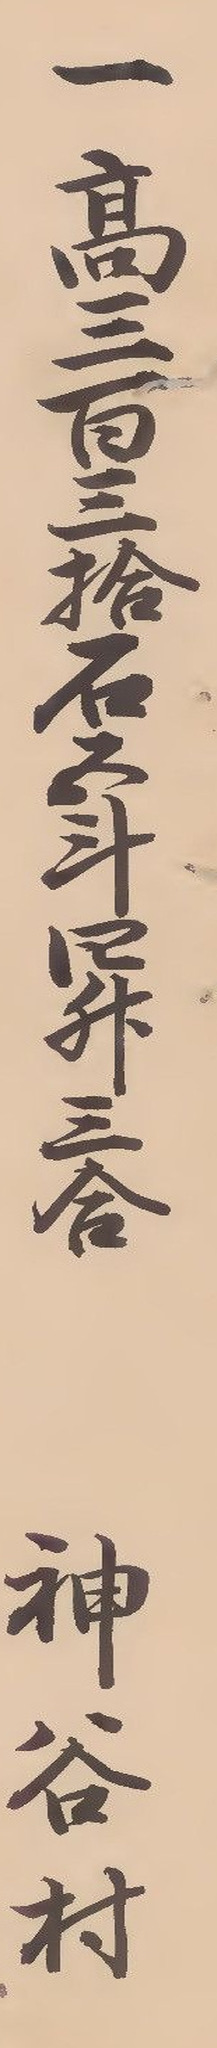一高三百三拾石五斗四升三合神谷村
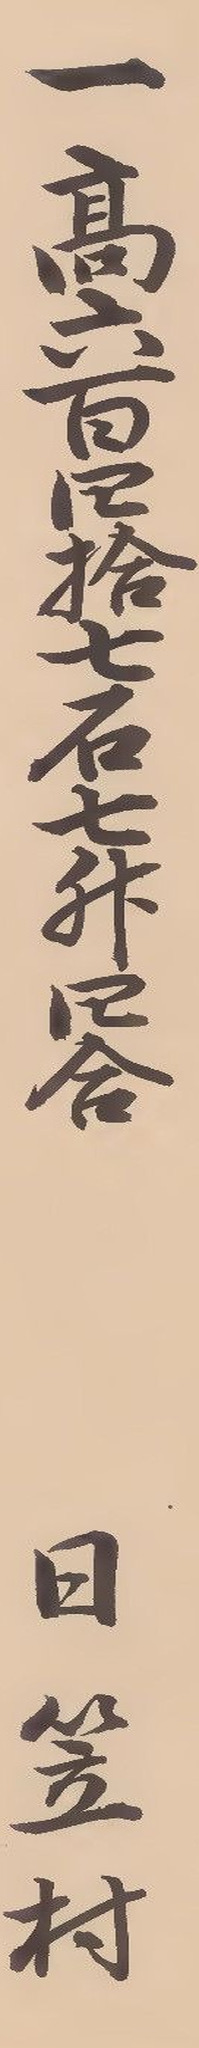一高六百四拾七石七升四合日笠村
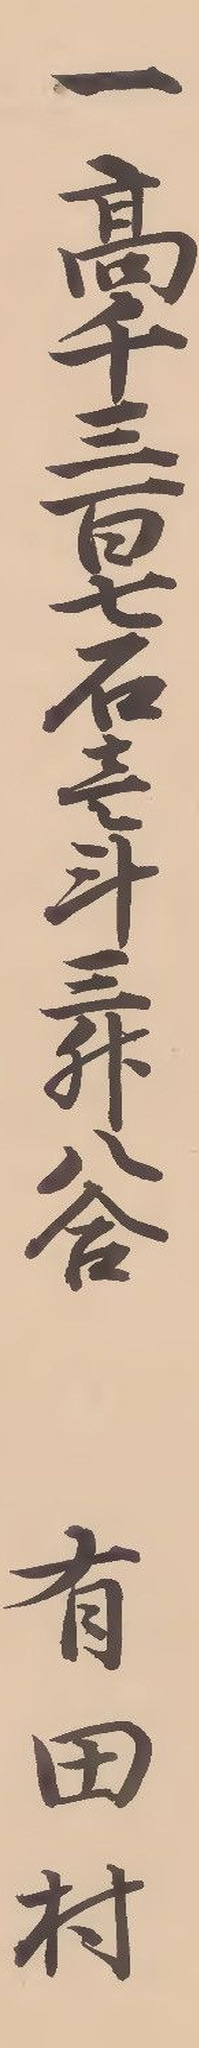一高千三百七石壱斗三升八合有田村
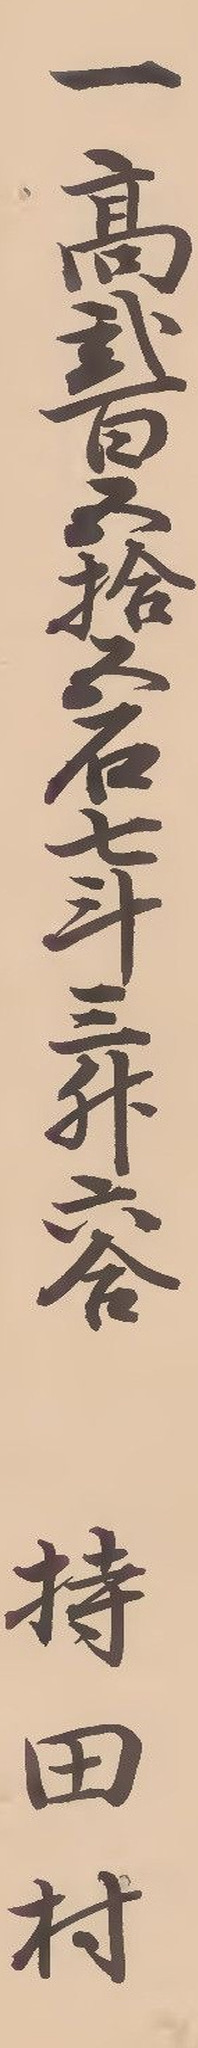一高弐百五拾五石七斗三升六合持田村
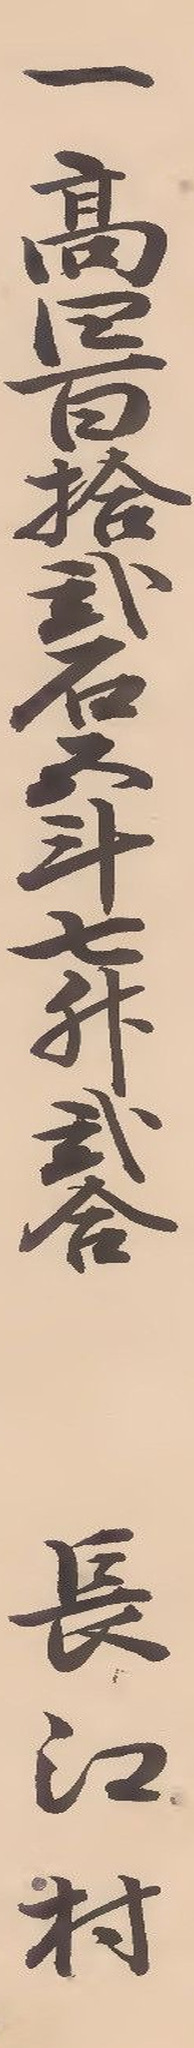一高四百拾弐石五斗七升弐合長江村
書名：若狭国郷帳
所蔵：国立公文書館 National Archives of Japan
